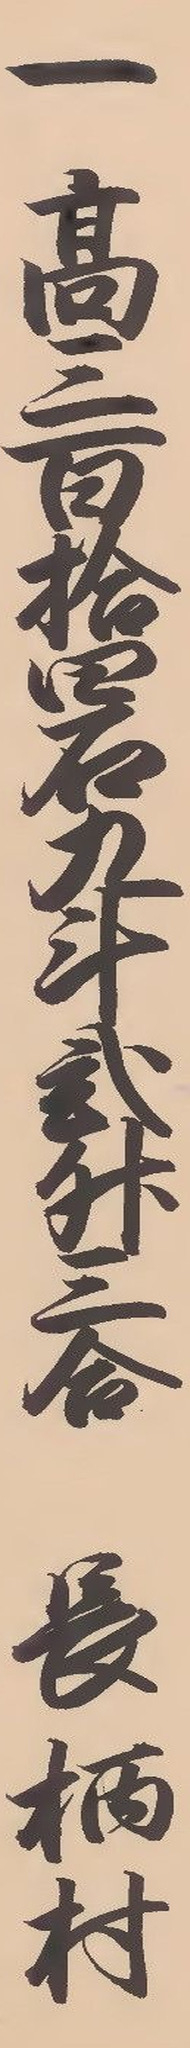一高三百拾四石九斗弐升三合長柄村
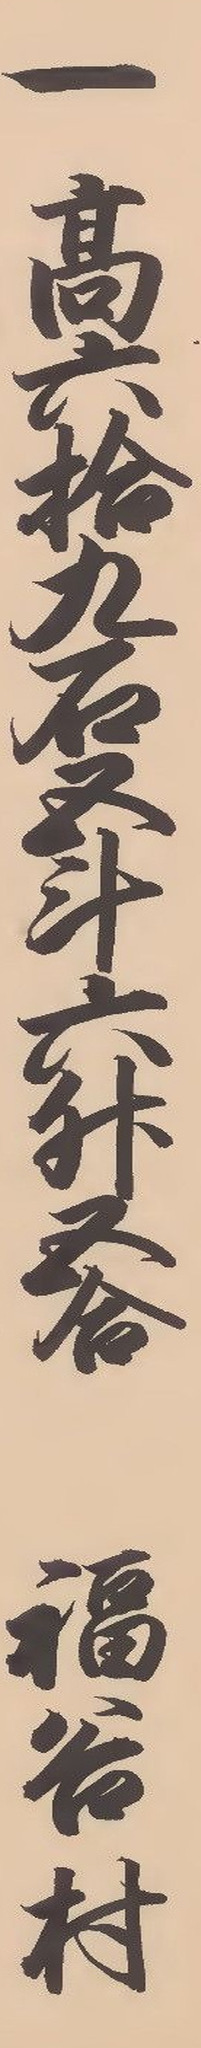一高六拾九石五斗六升五合福谷村
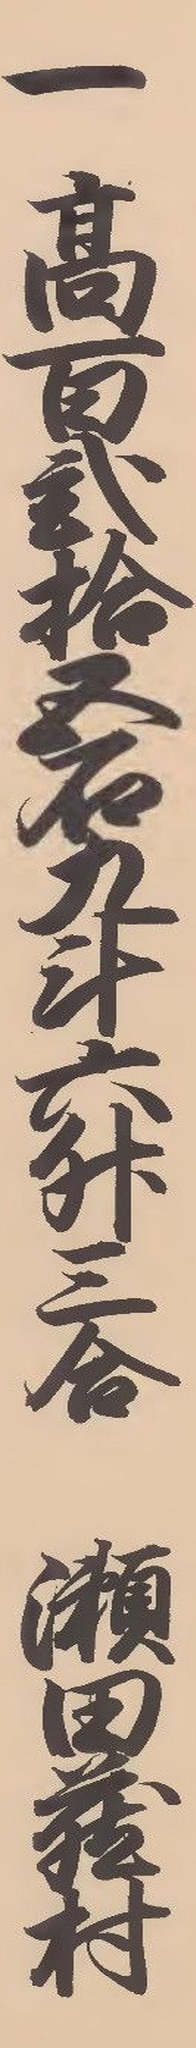一高百弐拾五石九斗六升三合瀬田蔵村
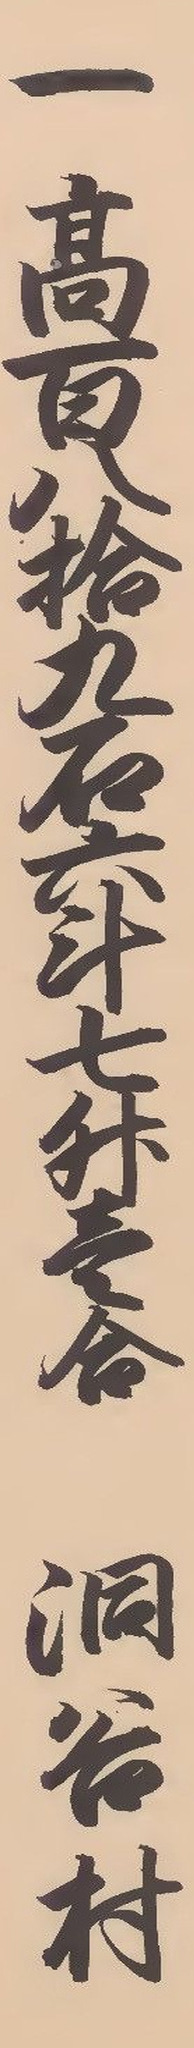一高百八拾九石六斗七升壱合洞谷村

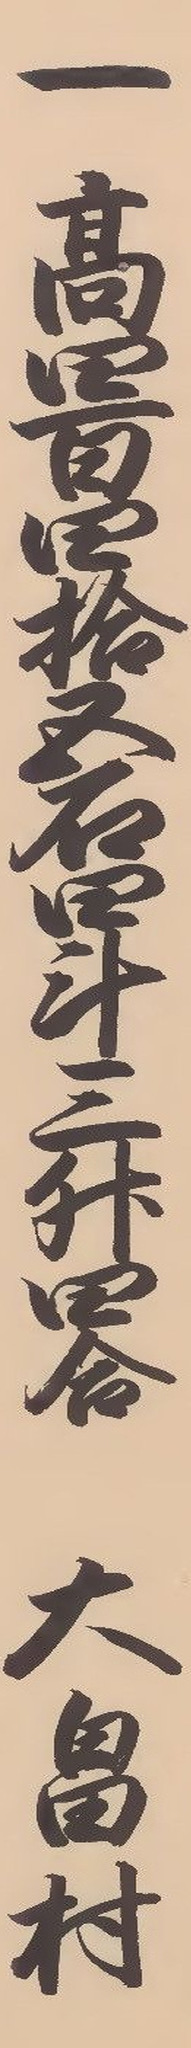一高四百四拾五石四斗三升四合大畠村
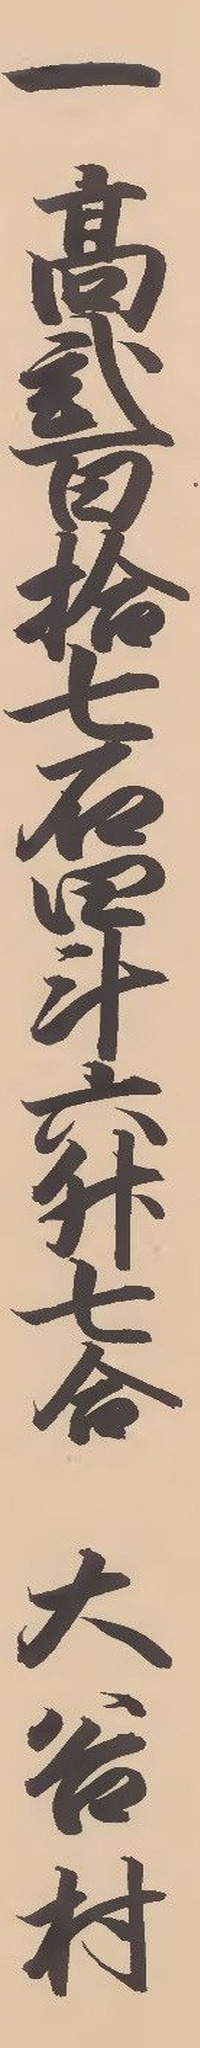一高弐百拾七石四斗六升七合大谷村
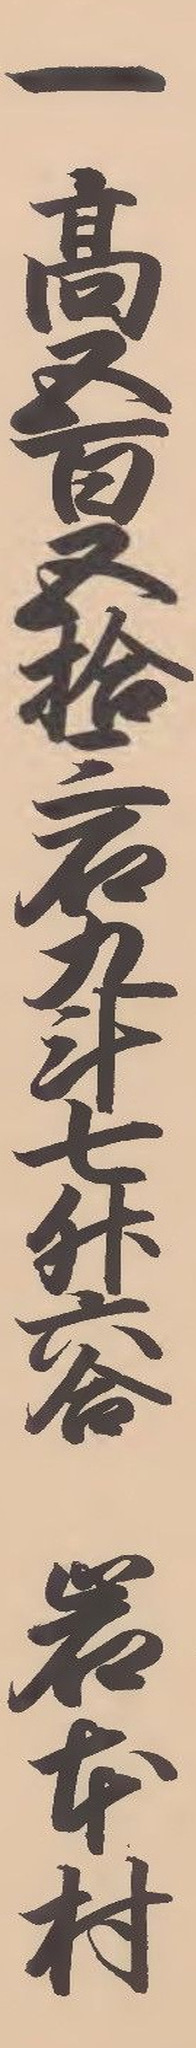一高五百五拾三石九斗七升六合岩本村
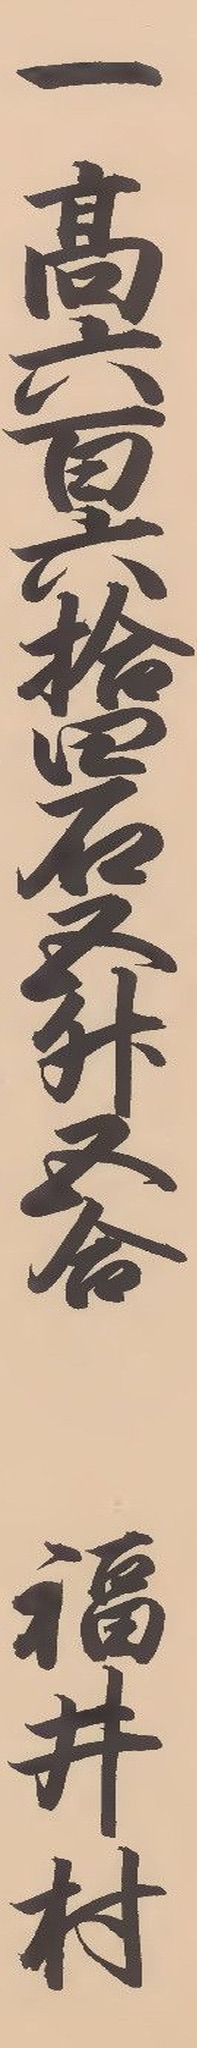一高六百六拾四石五升五合福井村
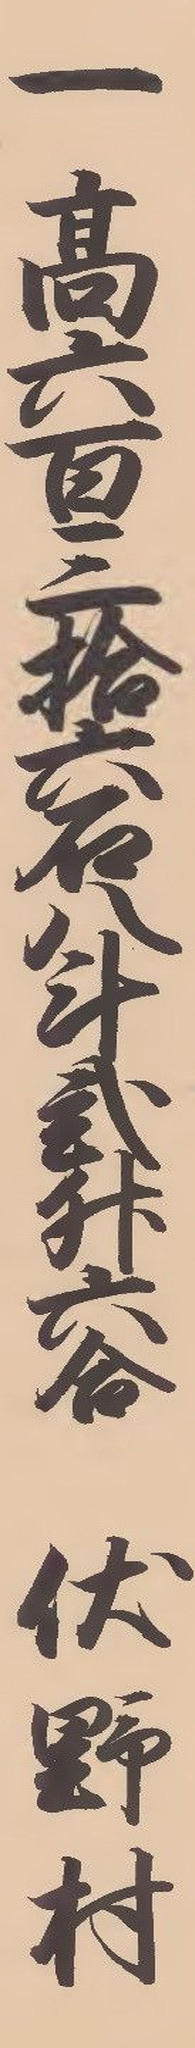一高六百三拾六石八斗弐升六合伏野村
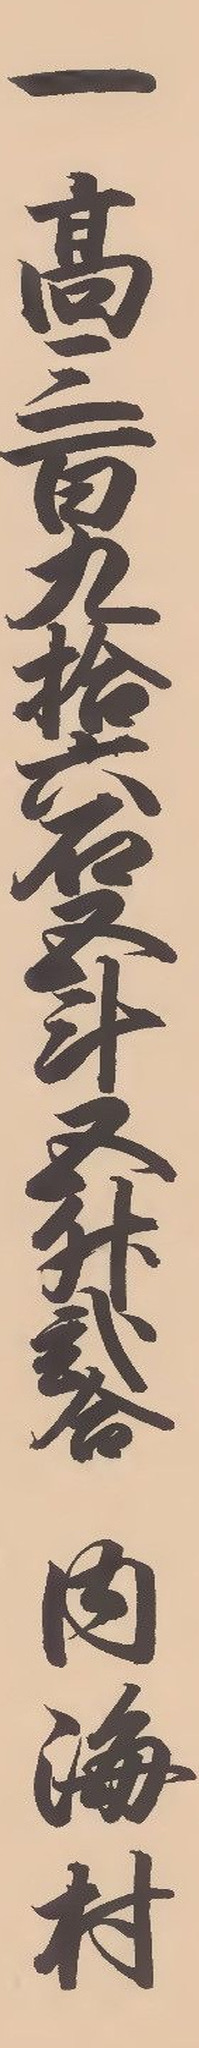一高三百九拾六石五斗五升弐合内海村
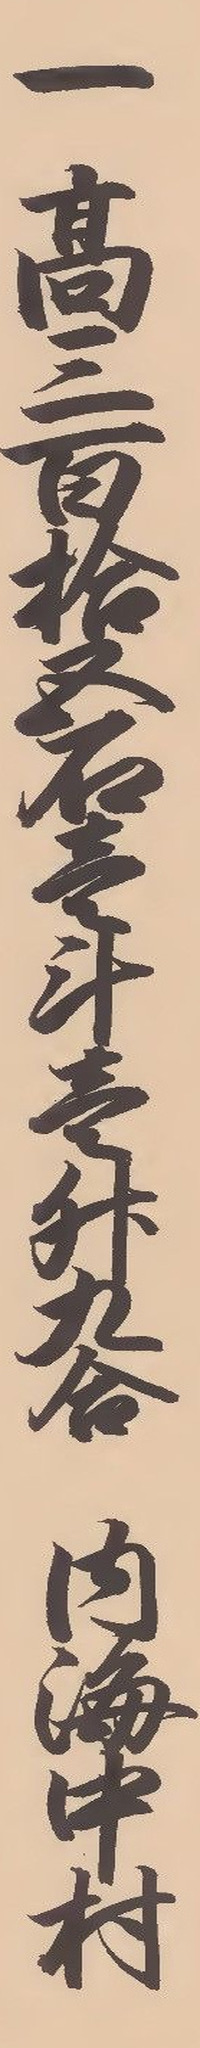一高三百拾五石壱斗壱升九合内海中村
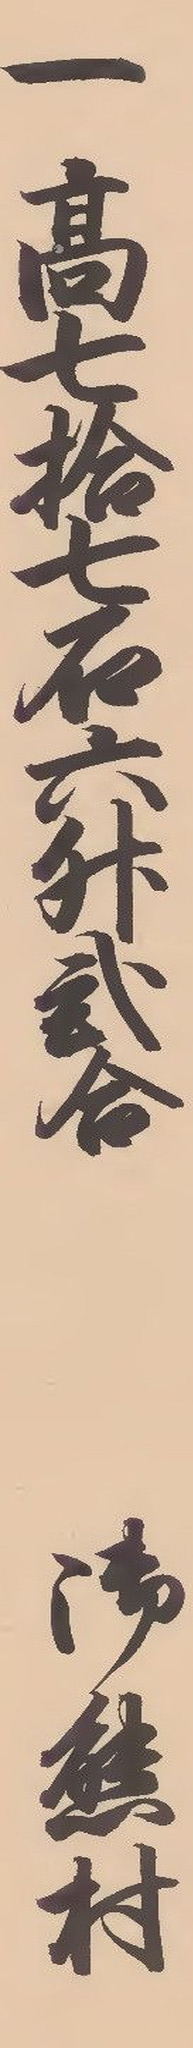一高七拾七石六升弐合御熊村

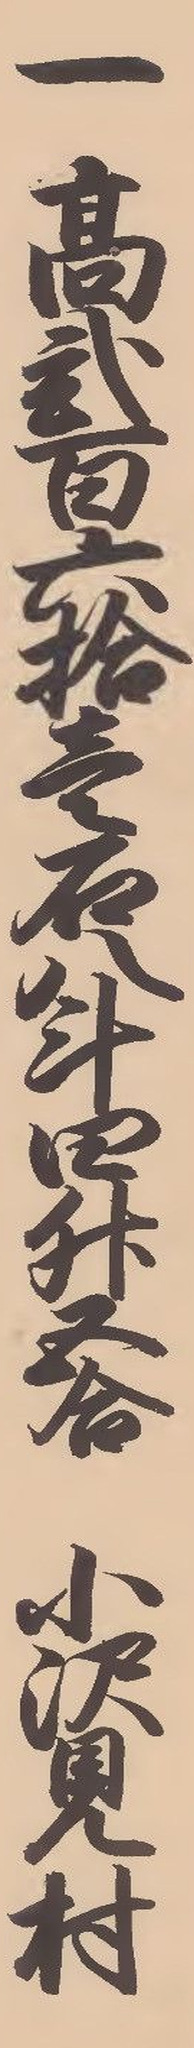一高弐百六拾壱石八斗四升五合小沢見村
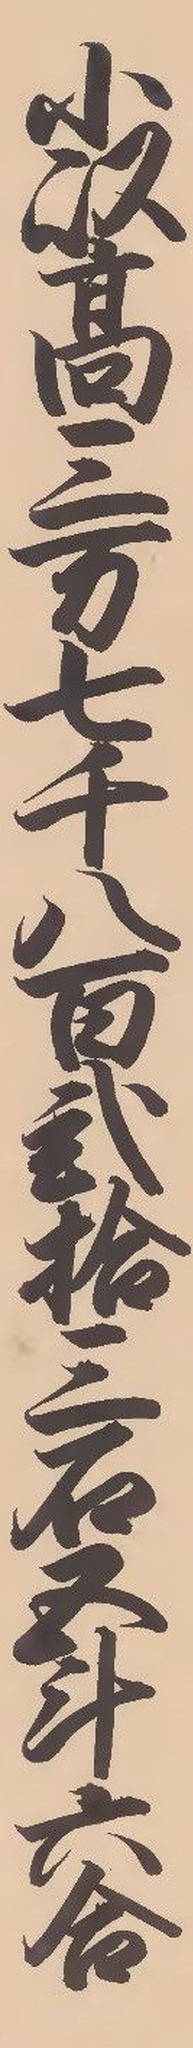小以高三万七千八百弐拾三石五斗六合
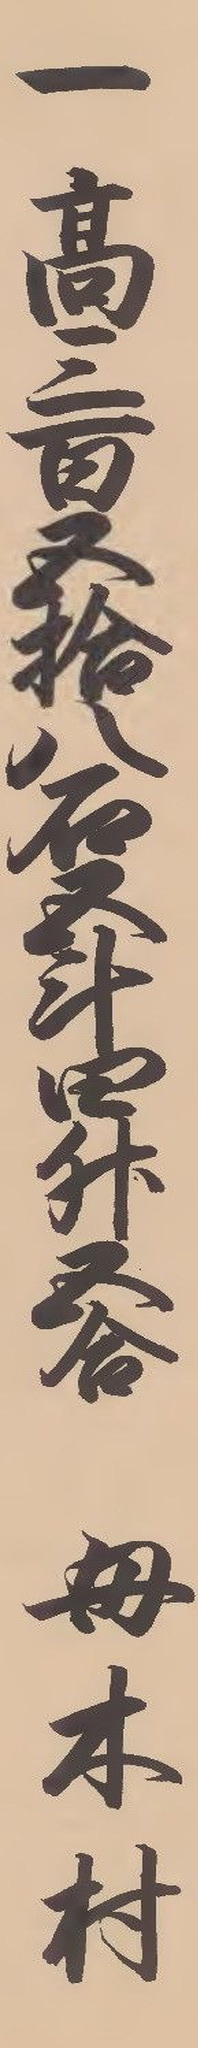一高三百五拾八石五斗四升五合母木村

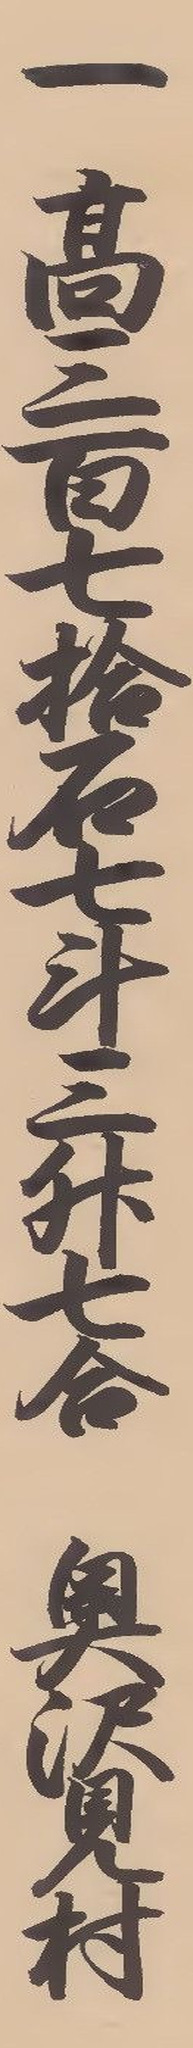一高三百七拾石七斗三升七合奥沢見村
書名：因幡国郷帳
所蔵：国立公文書館 National Archives of Japan
